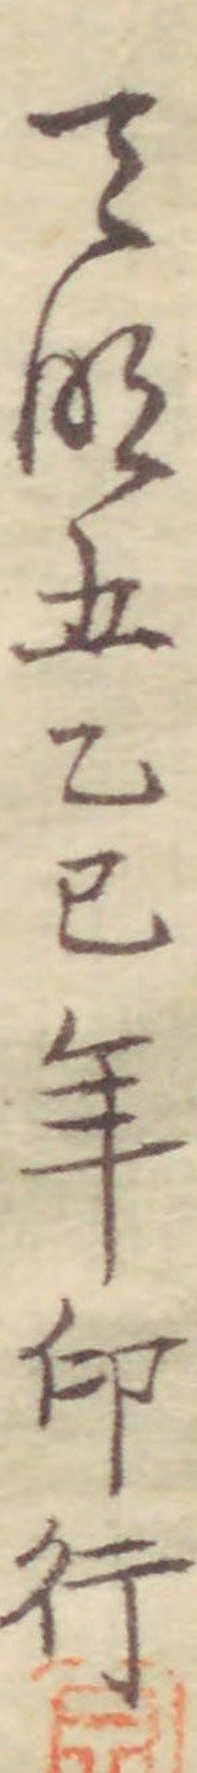天明五乙巳年印行
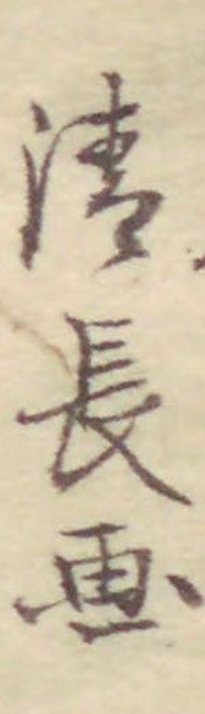清長画
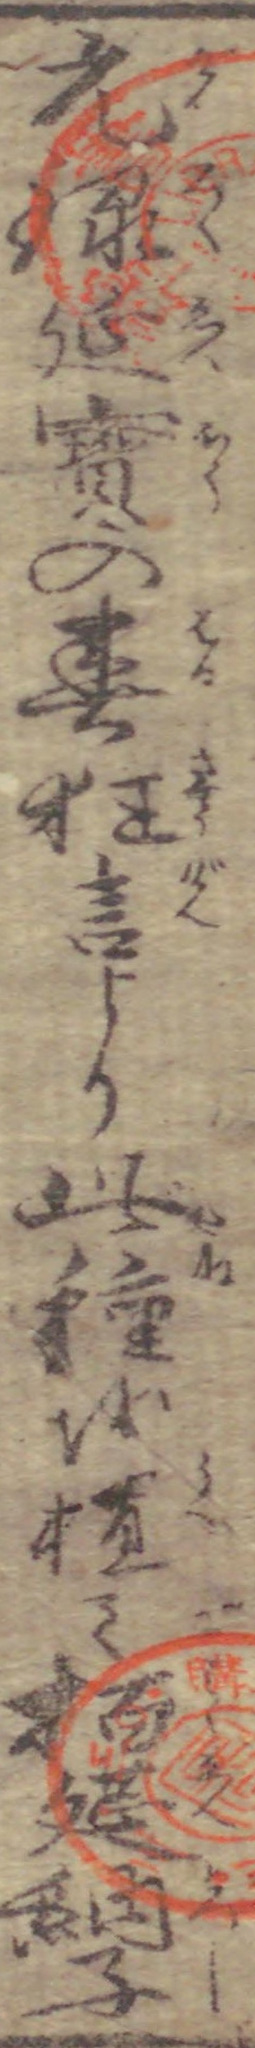元禄延宝の春狂言より此種を植て栢莚納子
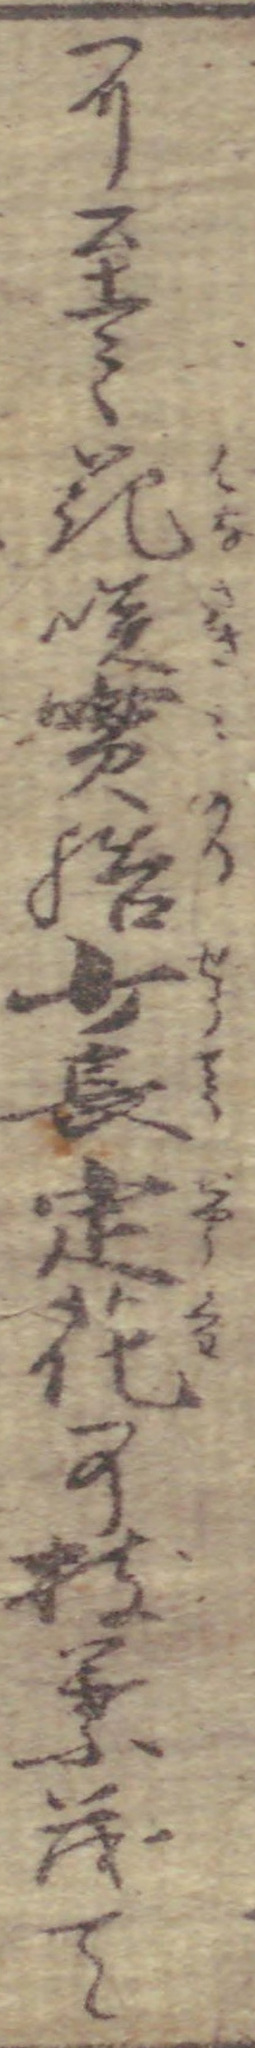に至て花咲実結少長定花に枝葉茂て
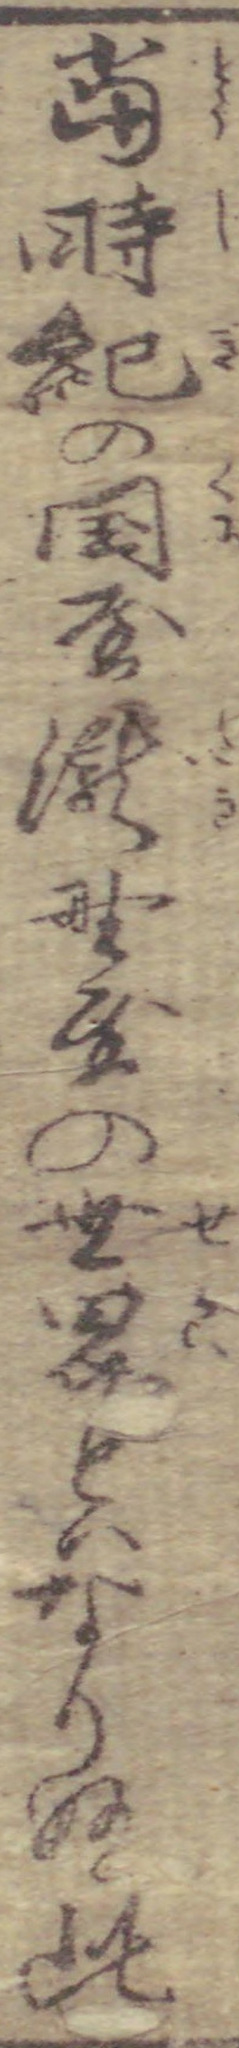当時紀の国屋瀧野屋の世界とはなりぬる此
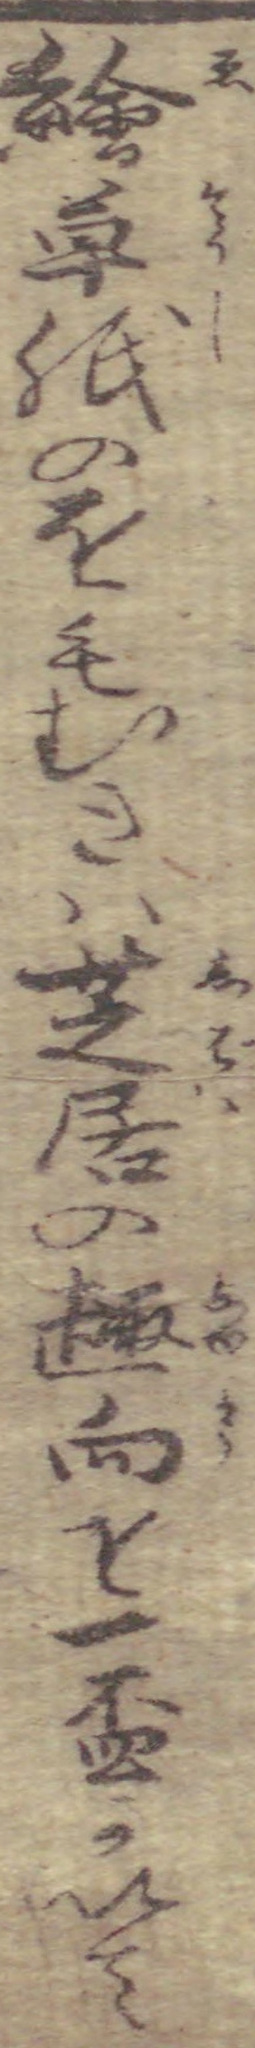絵草子のをもむきは芝居の趣向と一盃か以て
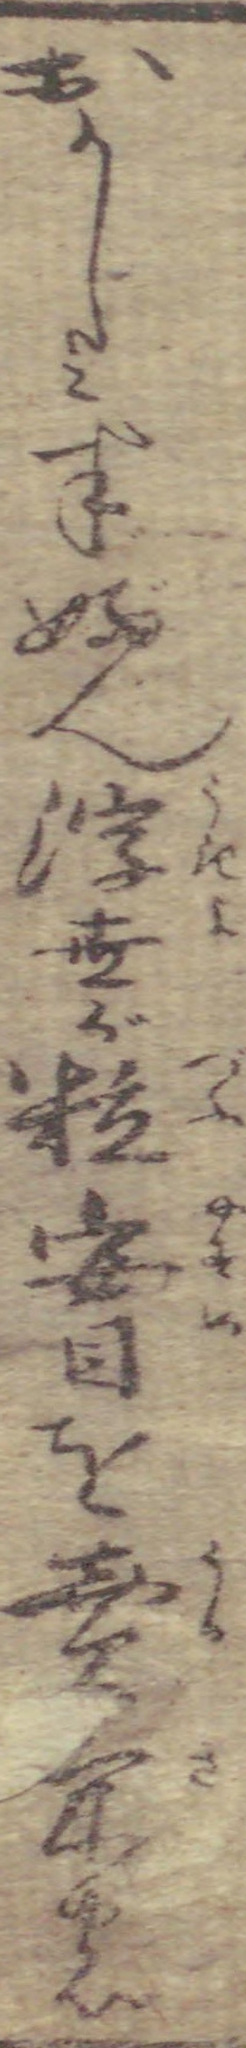おかしみ半ふん浮世が粒安目を売気の
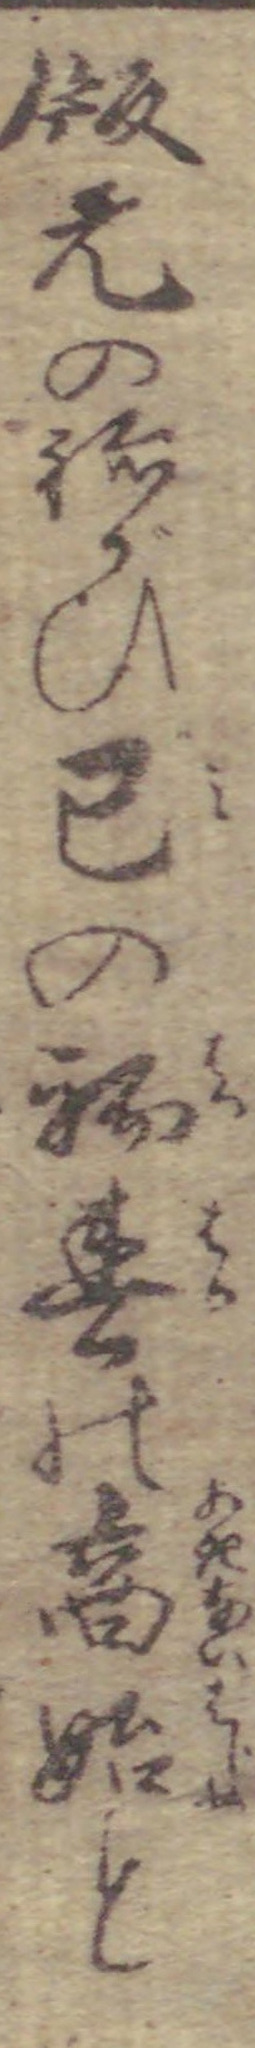版元のねがひ巳の初春の商始と
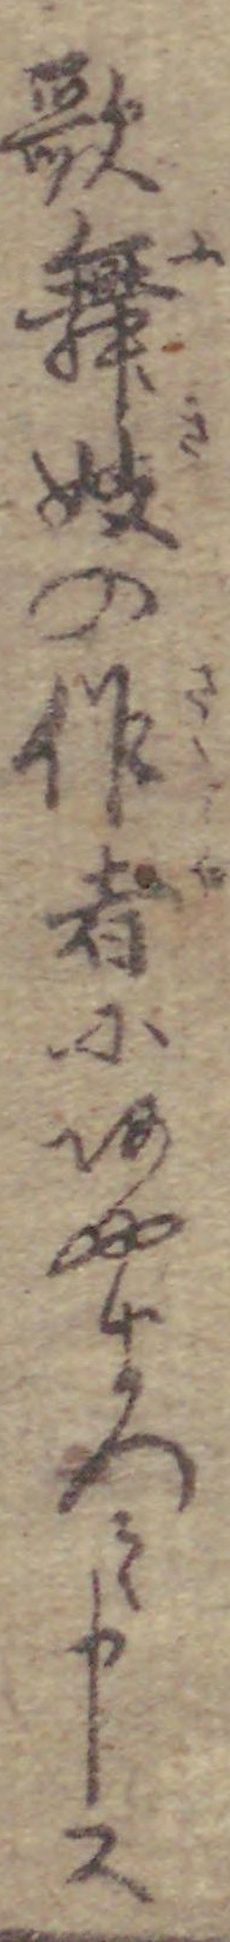歌舞伎の作者にあやまつて申す

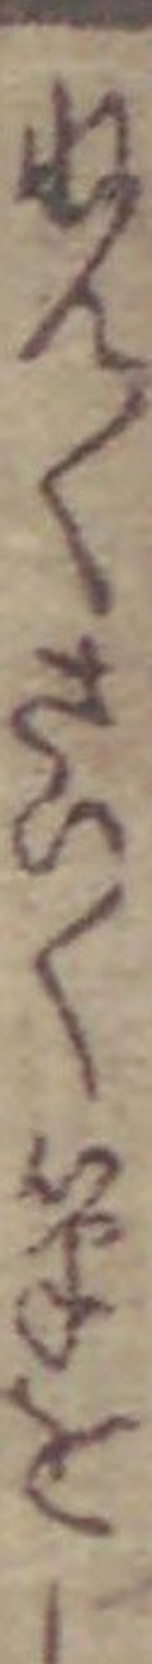ねん〳〵さい〳〵筆を
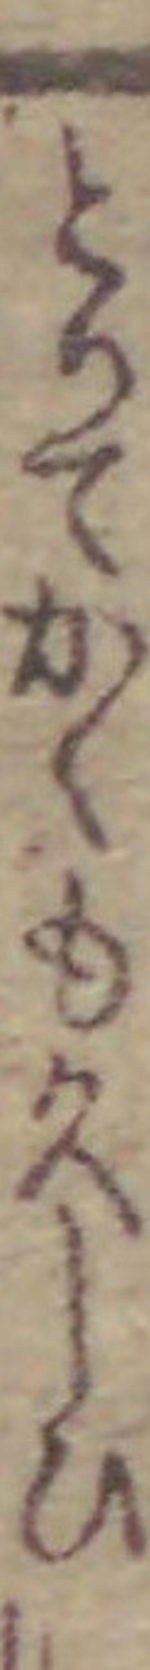とりてかくも久しひ
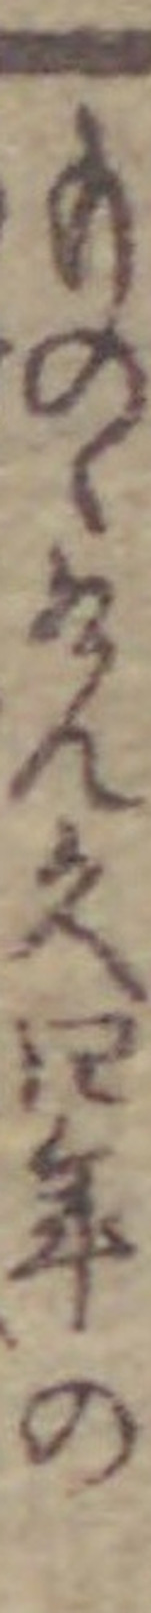ものゝけん久四年の
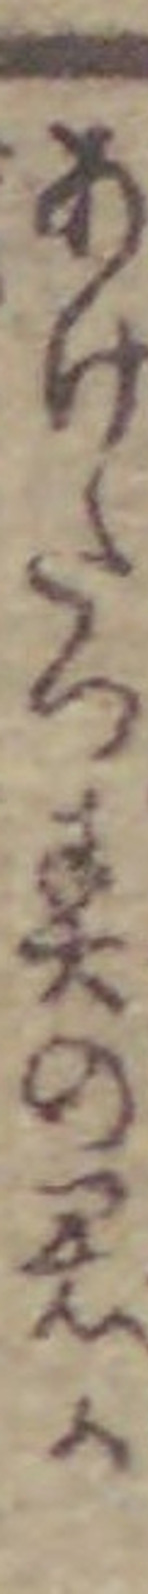あけたつ春の君か
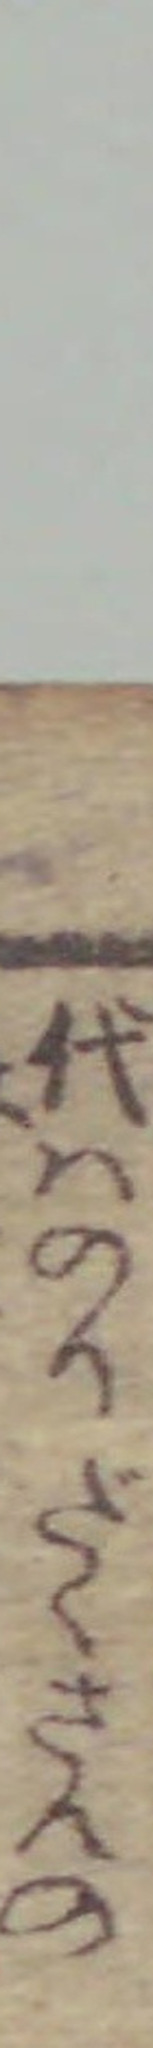代はのりだくさんの
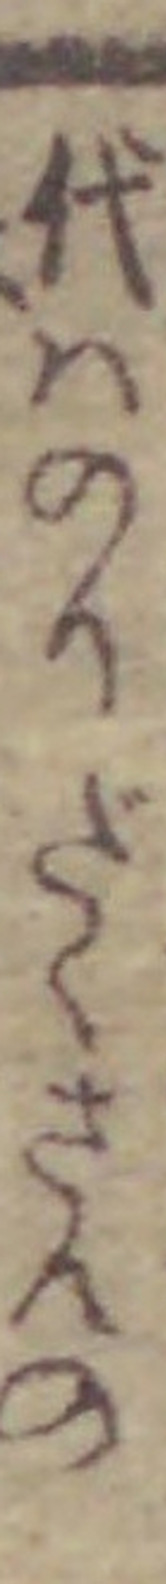代はのりだくさんの
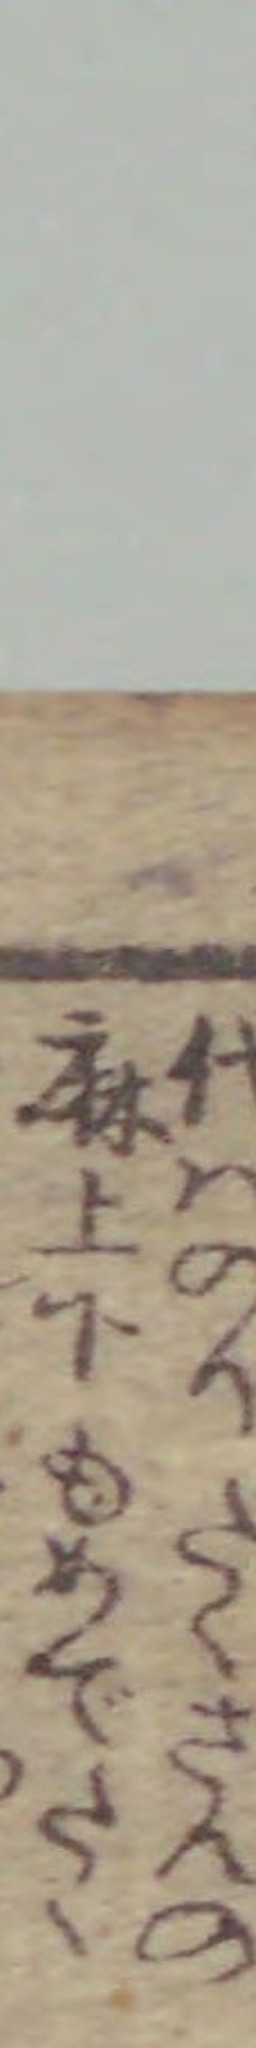麻上下もめでたく
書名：間似合嘘言曽我 3巻
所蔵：国立国会図書館 National Diet Library, JAPAN
